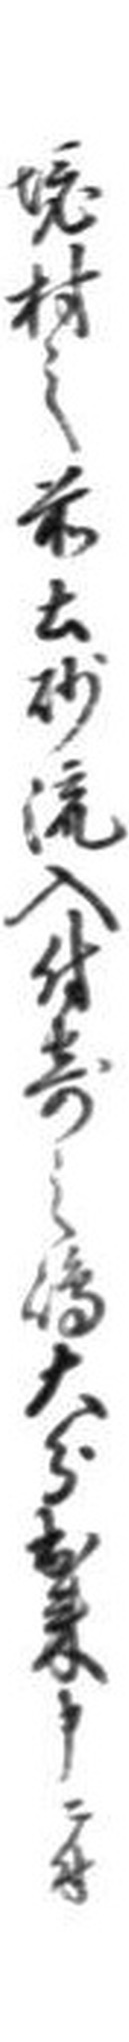境村之前土砂流入付寄之嶋大分出来申ニ付
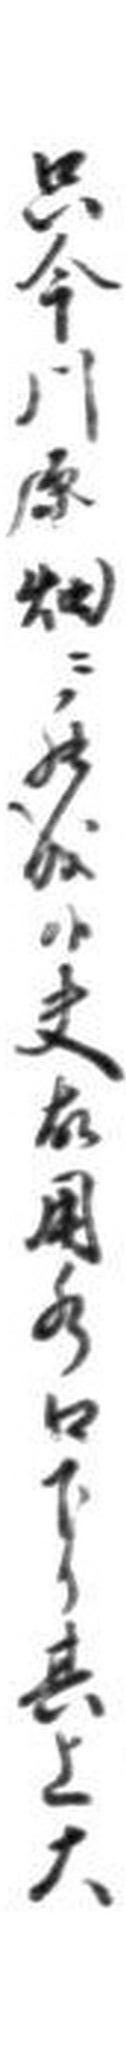只今川原畑ニ罷成候夫故用水口下り其上大
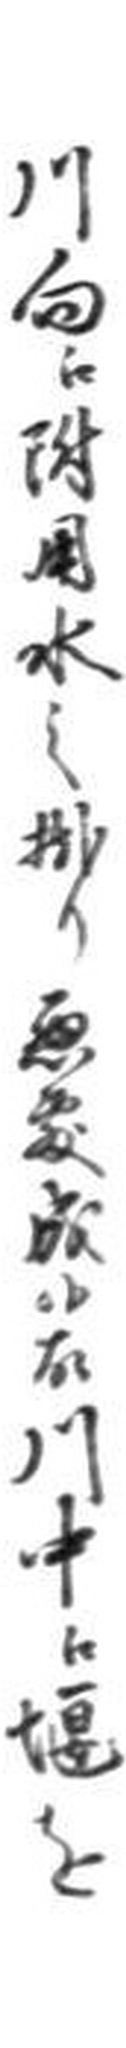川向江付用水之掛り悪敷成候故川中江堰を

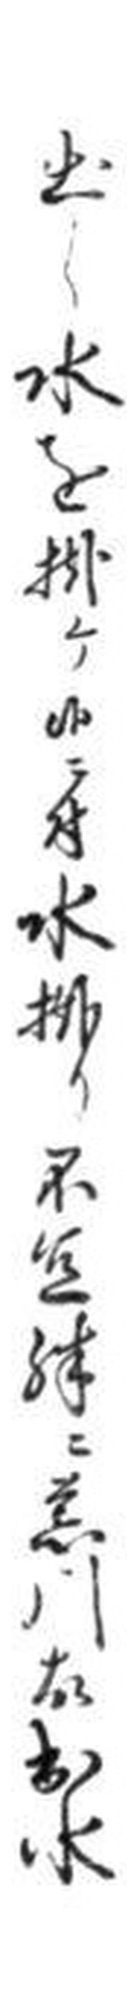出し水を掛ケ候ニ付水掛り不宜殊ニ荒川故出水
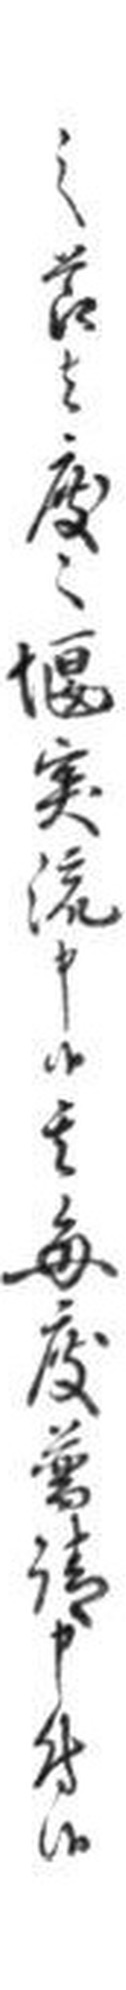之節者度々堰実流申候其毎度普請申付候
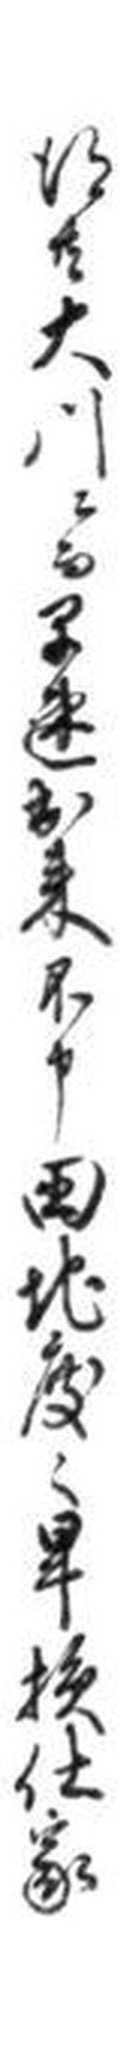得共大川ニ而早速出来不申田地度々旱損仕家
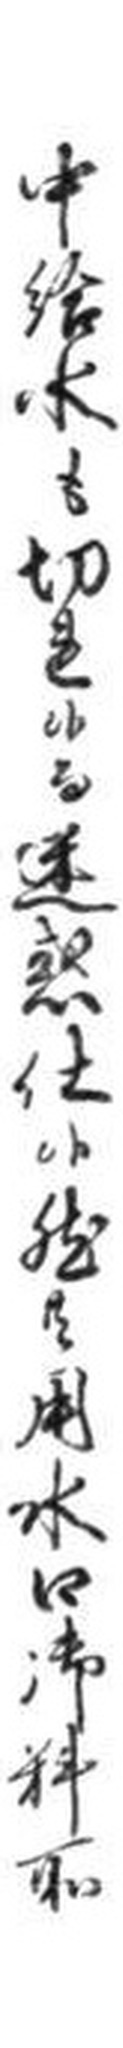中給水も切れ候而迷惑仕候然共用水口御料所
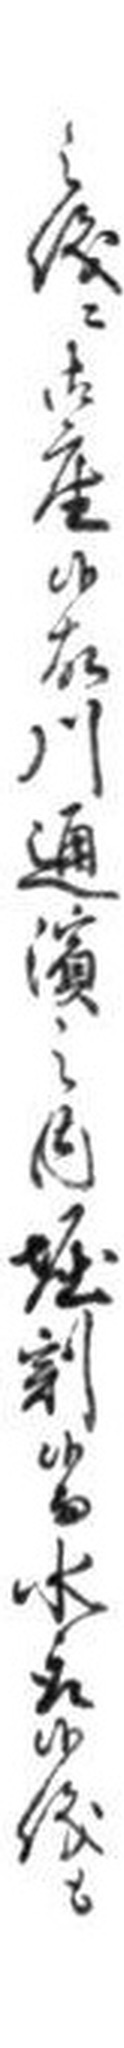之儀ニ御座候故川通浜之内掘割候而水取候儀も
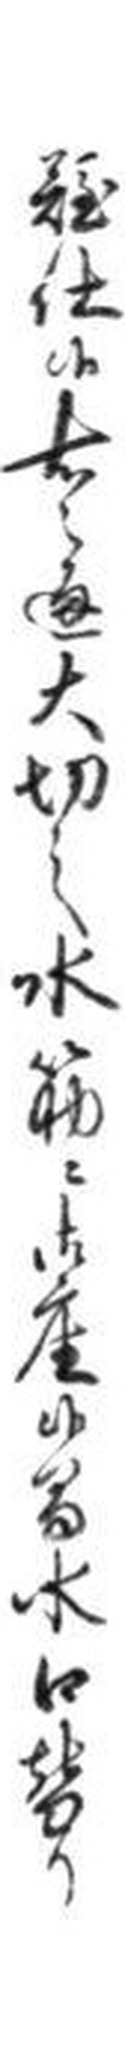難仕候右之通大切之水筋ニ御座候間水口替り
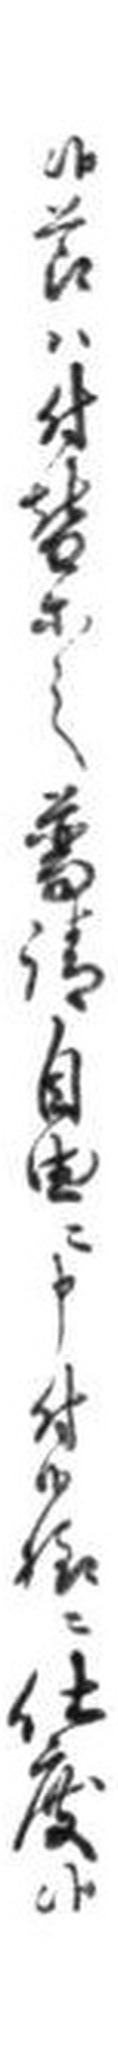候節ハ付替等之普請自由ニ申付候様ニ仕度候
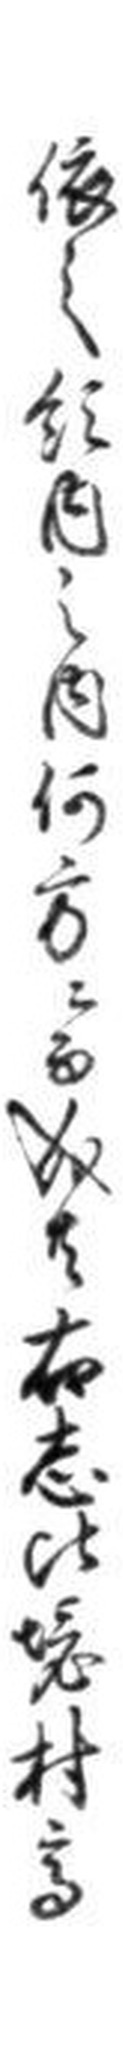依之領内之内何方ニ而成共右志比境村高
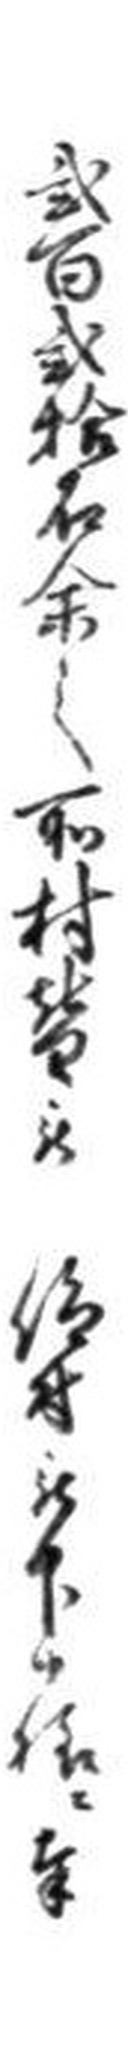弐百弐拾石余之所村替被仰付被下候様ニ奉
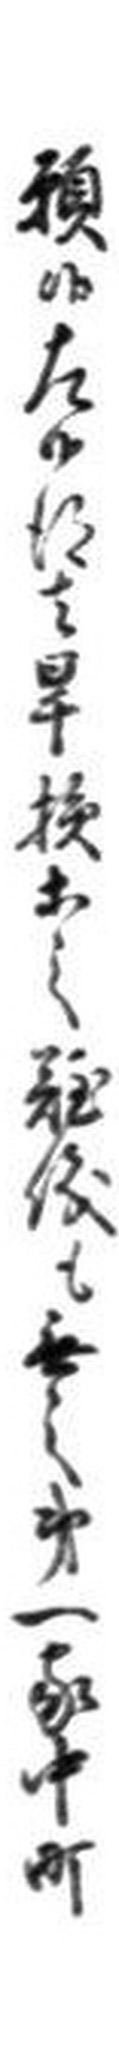願候左候得者旱損等之難儀も無之第一家中町
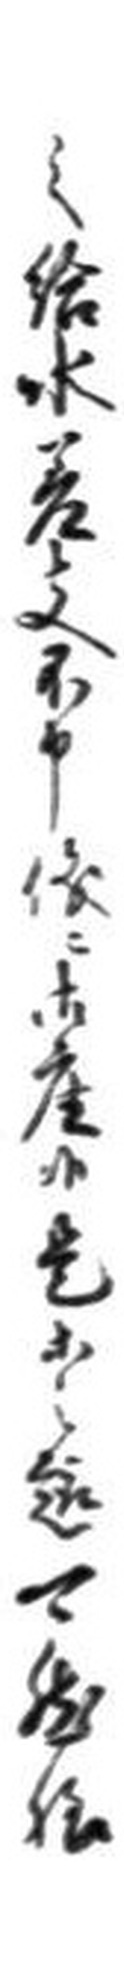之給水差不申儀ニ御座候是等之趣可然様
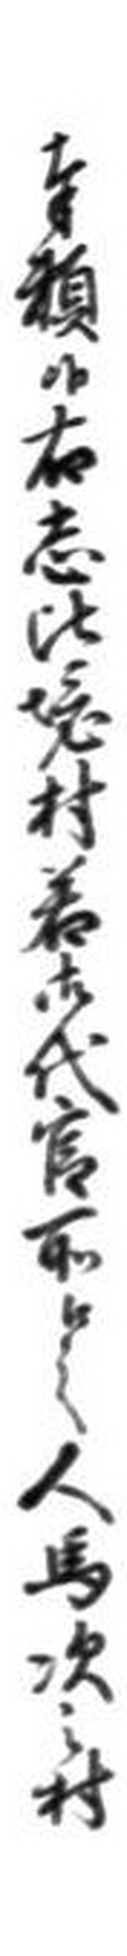奉頼候右志比境村若御代官所江之人馬次之村
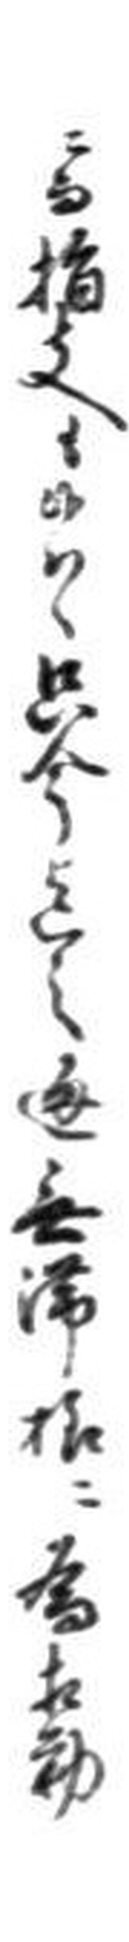ニ而指支も候ハヽ只今迄之通無滞様ニ為相勤
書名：家譜 三十三 吉邦公 享保四年
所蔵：福井県文書館 Fukui Prefectural Archives
